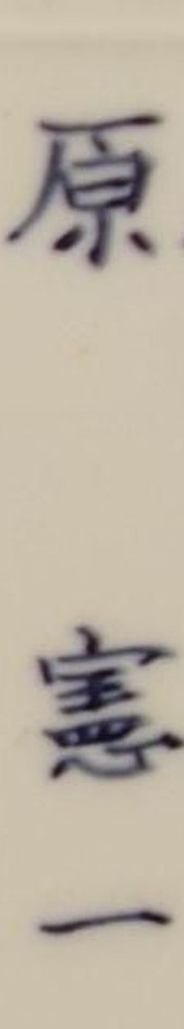原憲一
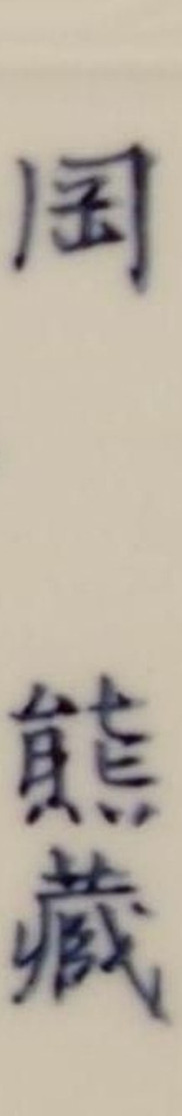岡熊蔵
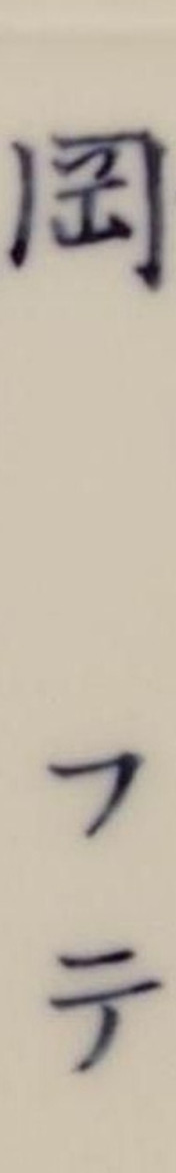岡フテ
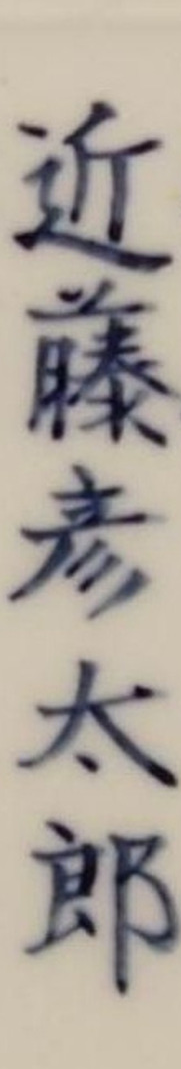近藤彦太郎
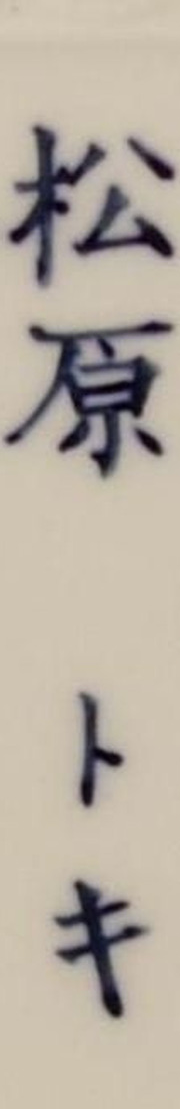松原トキ
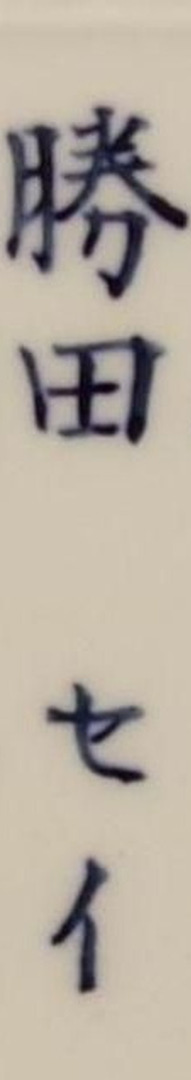勝田セイ
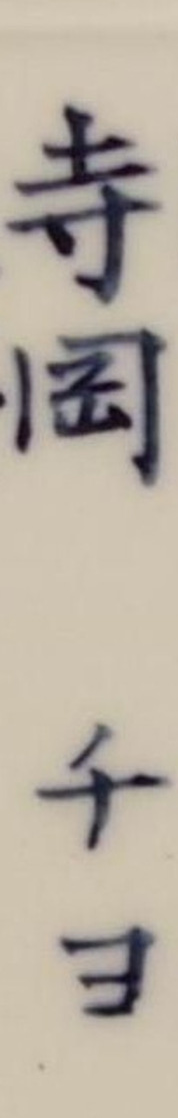寺岡チヨ
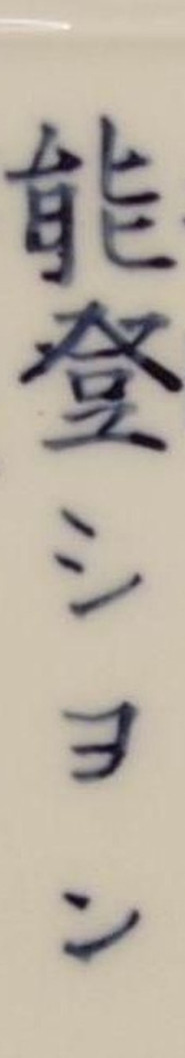能登シヨン
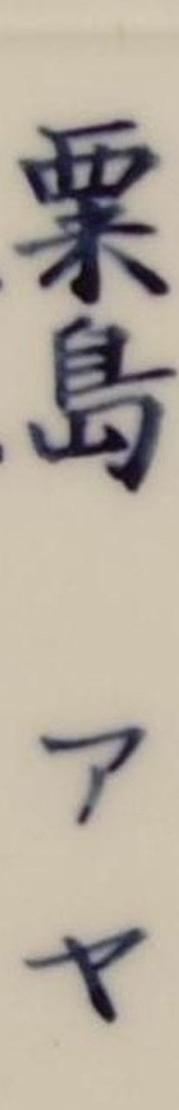粟島アヤ
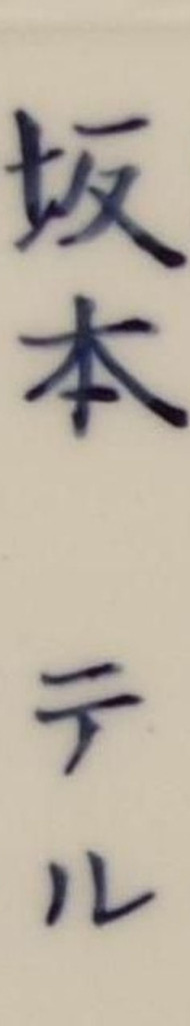坂本テル
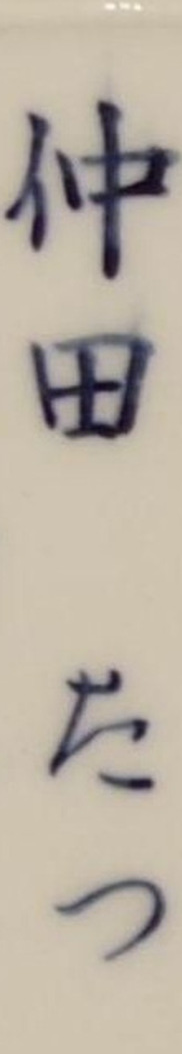仲田たつ
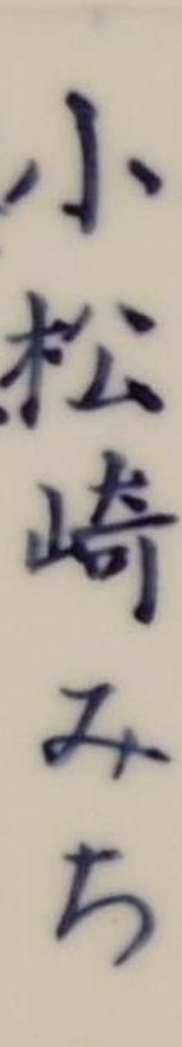小松崎みち
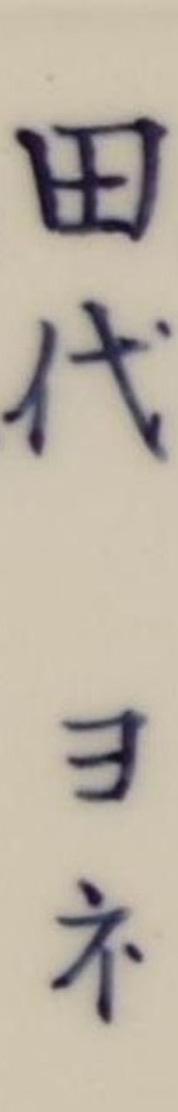田代ヨネ
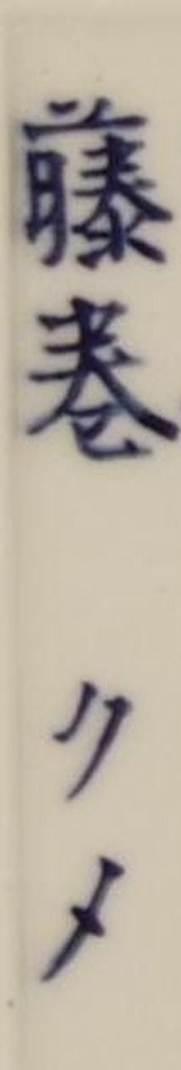藤巻クメ

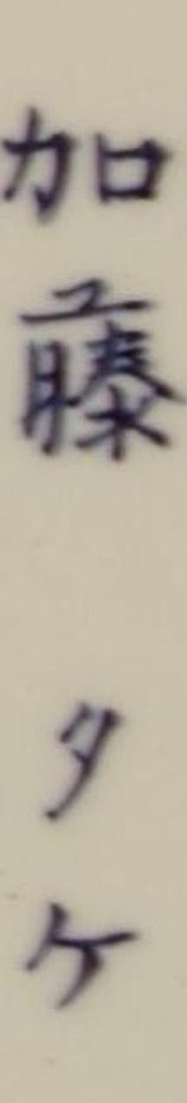加藤夕ケ
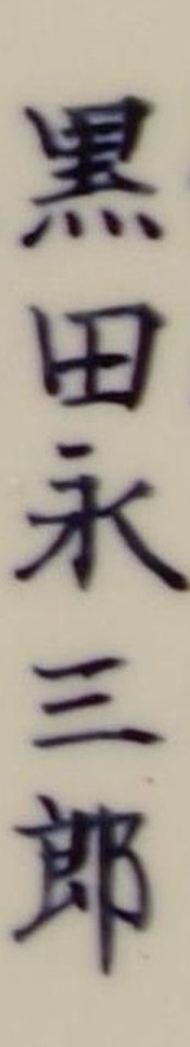黒田永三郎
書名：M~S
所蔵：高野山金剛峯寺
